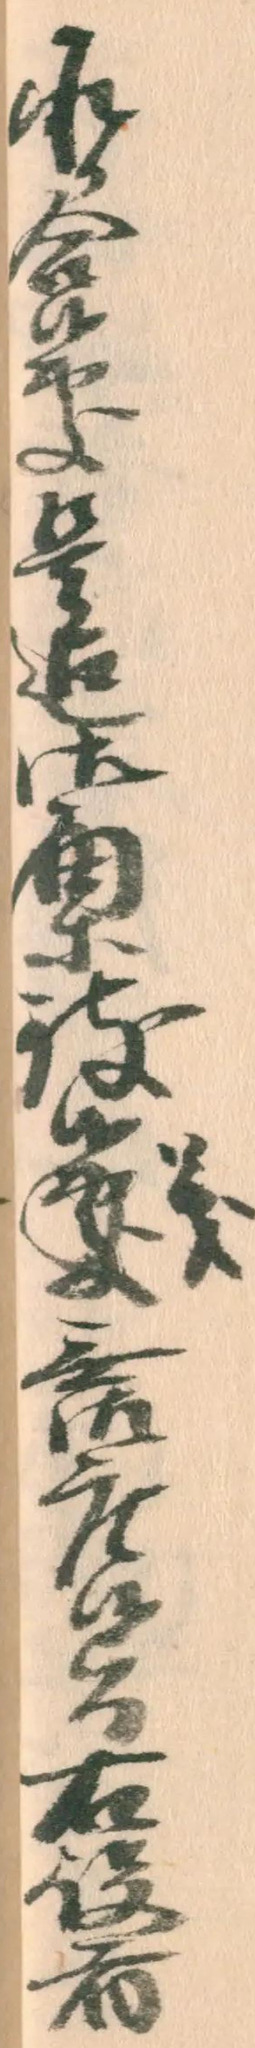承り合候處是迄御届等致候義無御座候旨右役者
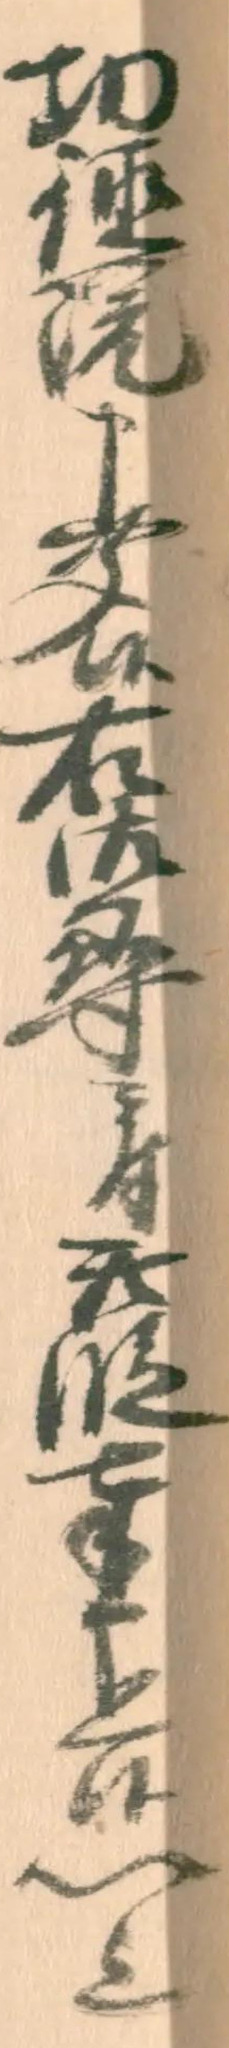功徳院申聞候右御尋ニ付此段奉申上候以上
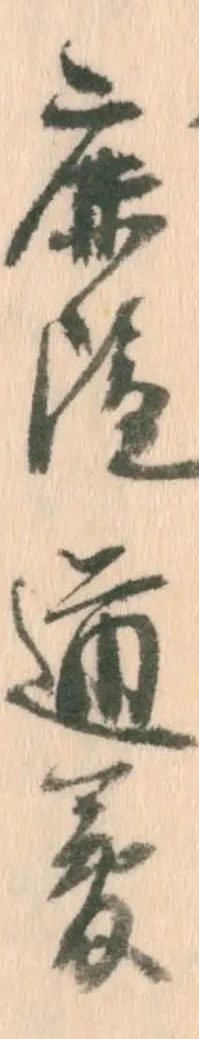鹿塩道菅
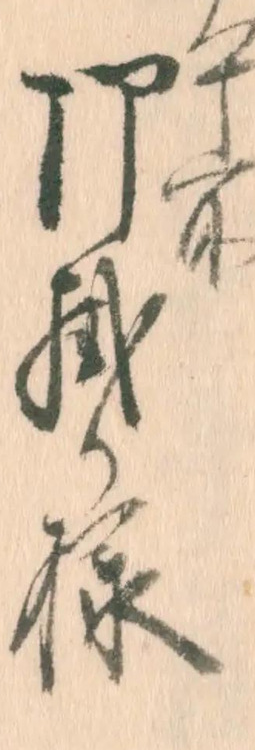御掛り様

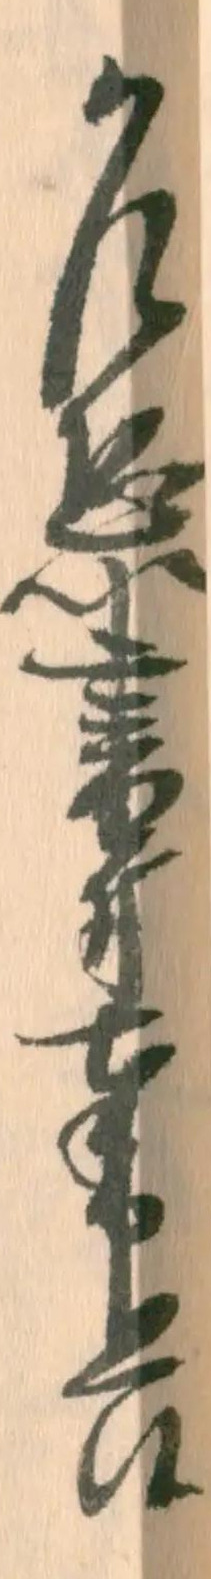乍恐以書付奉申上候
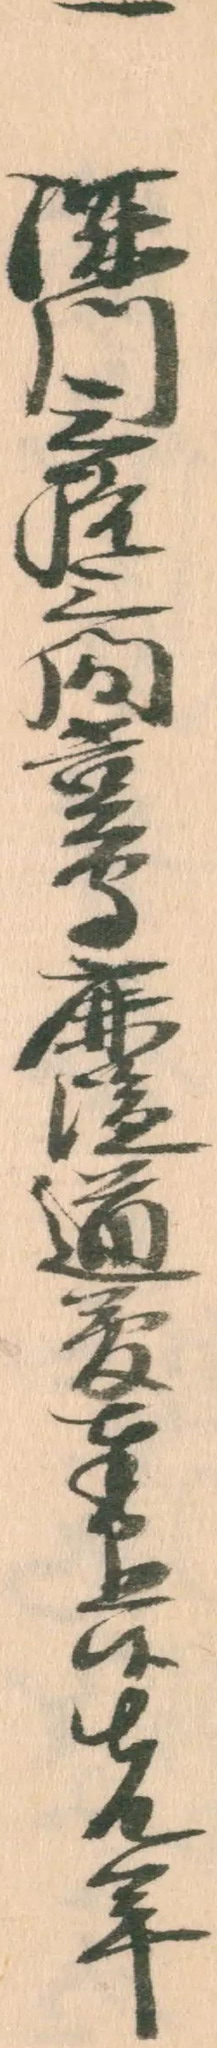一深川三拾三間堂守鹿塩道菅奉申上候先年
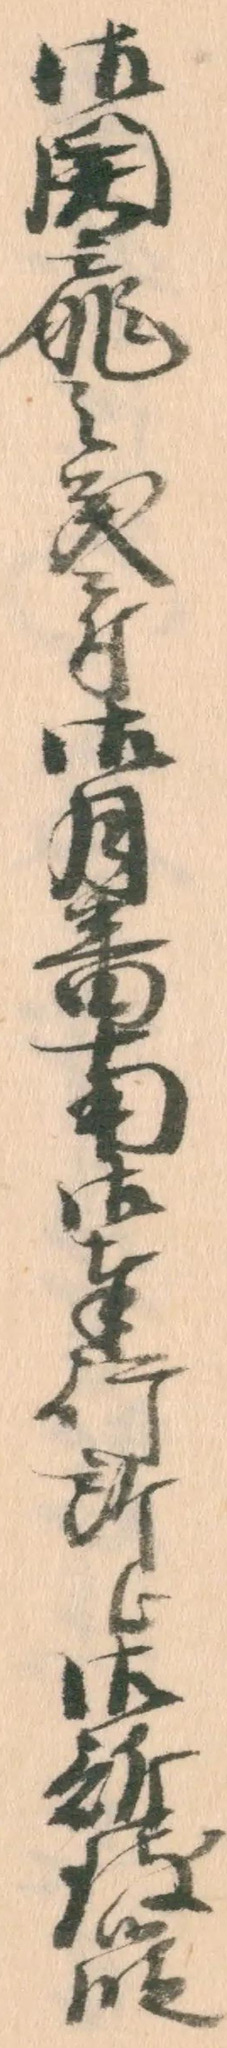御開扉之義に付御月番南御奉行所え御訴致候段
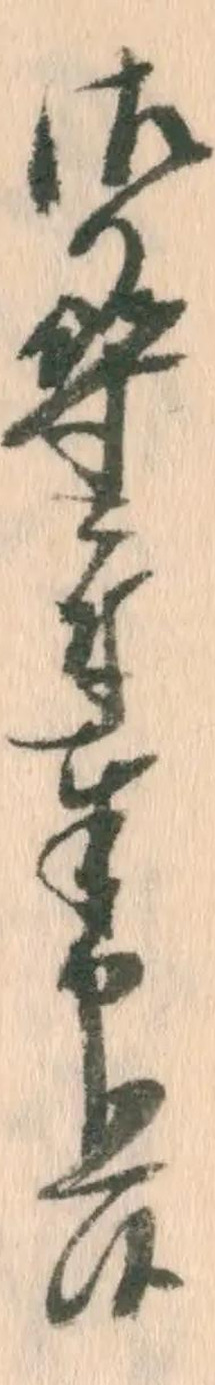御尋に付奉申上候
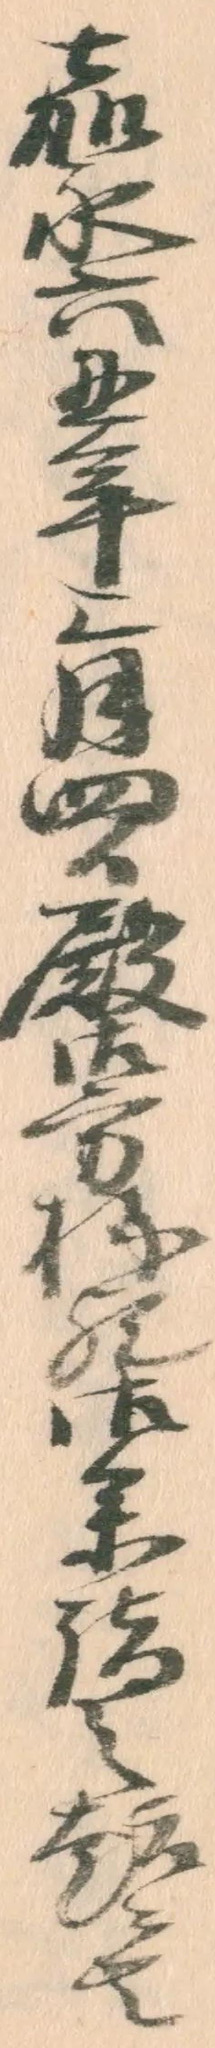一嘉永六丑年三月四日殿御方様歟御参詣之趣には
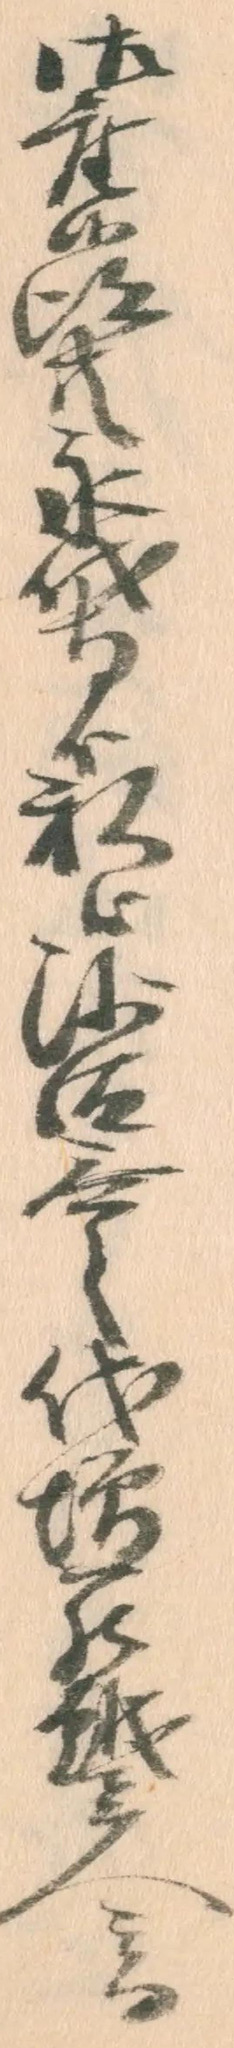御座候得共永代寺ゟ私え沙汰無之代僧罷越壱人に而

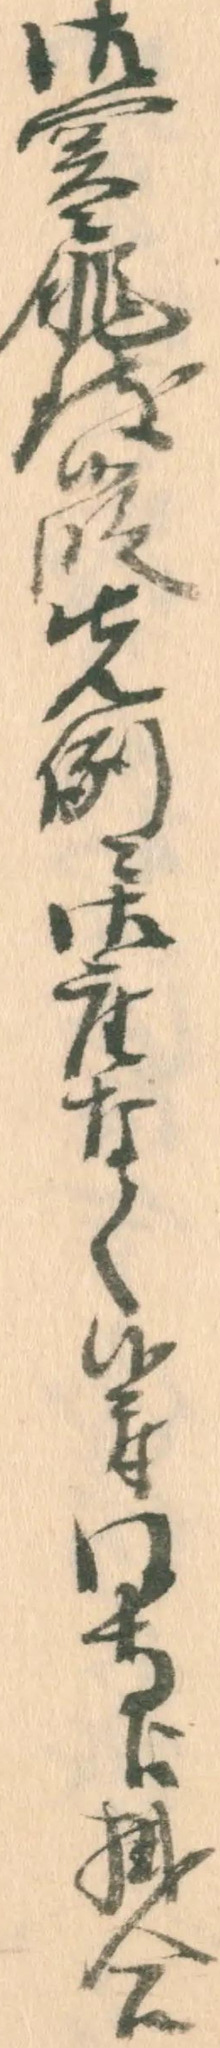御関扉致候段先例に御座なく候に付同寺え掛合
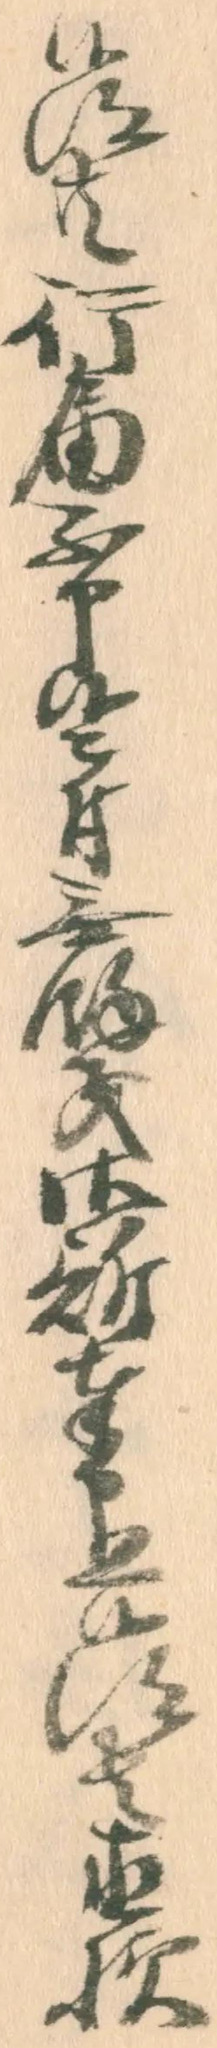候得共行届不申候に付無餘義御訴奉申上候得者直様
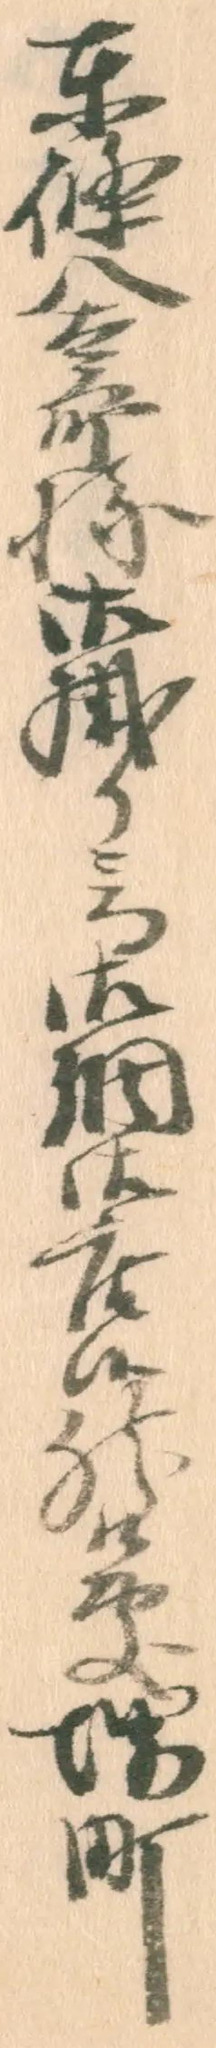東條八太郎様御掛りに而御調御座候然る処御町
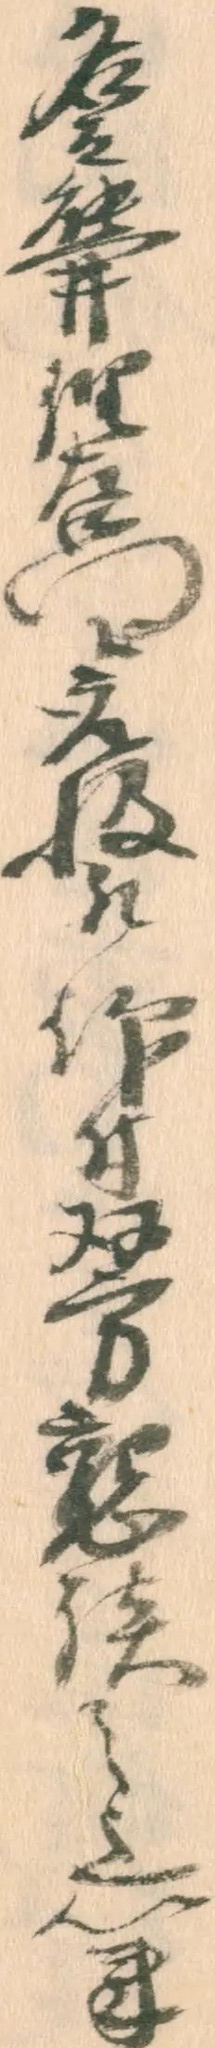名主熊井理左衛門江取扱被仰付双方熟談之上以来
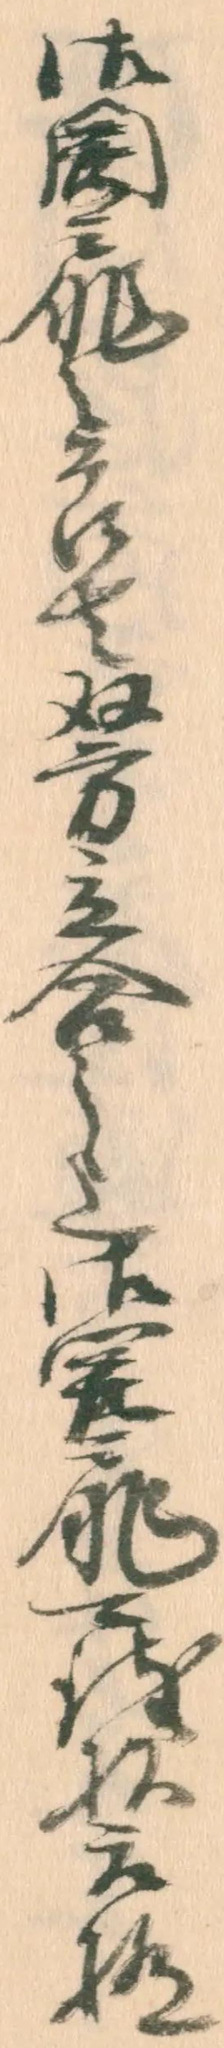御開扉之節者双方立合之上御開扉可致様取極
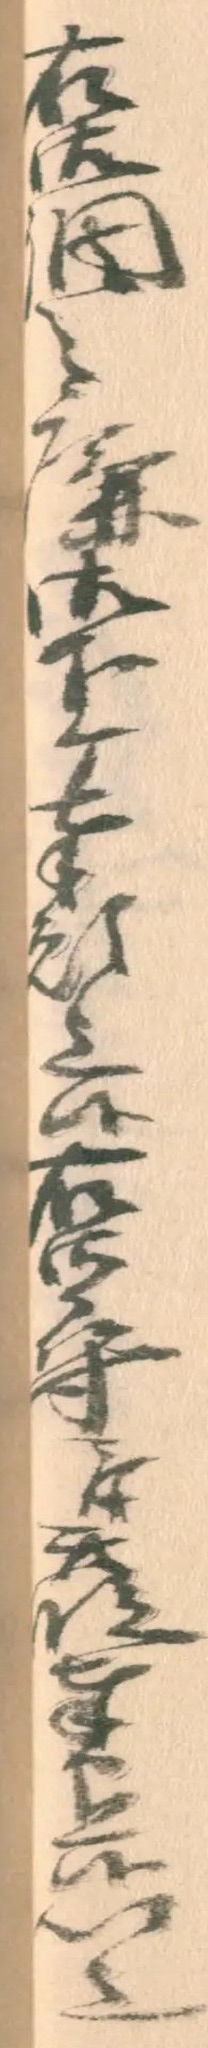右御調之廉御下ヶ奉願上候右御尋に付此段奉申上候以上
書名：三十三間堂. [1]
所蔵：国立国会図書館 National Diet Library, JAPAN
